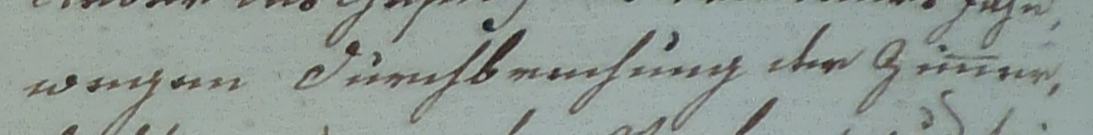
wegen Durchbrechung der Zim̅er,
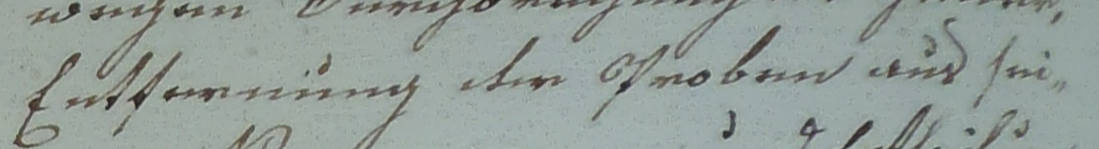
Entfernung der Proben aus sei¬
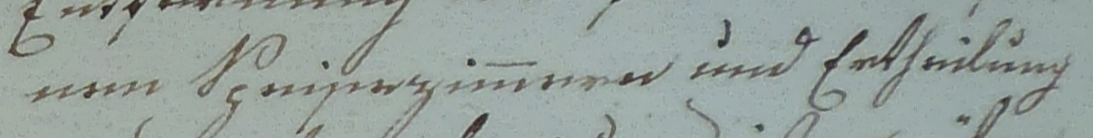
nem Speisezim̅ern und Ertheilung
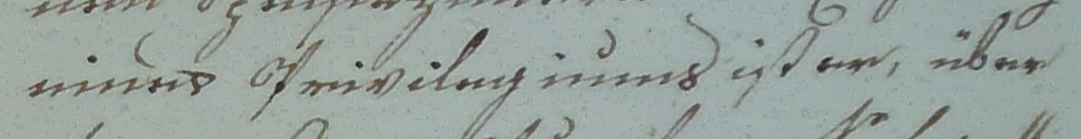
eines Privilegiums ist er, über
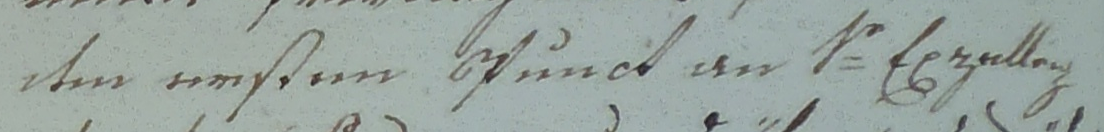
den ersten Punct an Se͇ Exzellenz
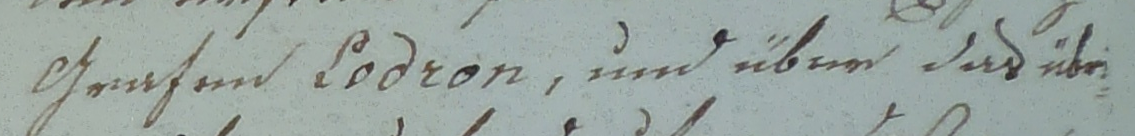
Grafen Lodron, und über das übri¬
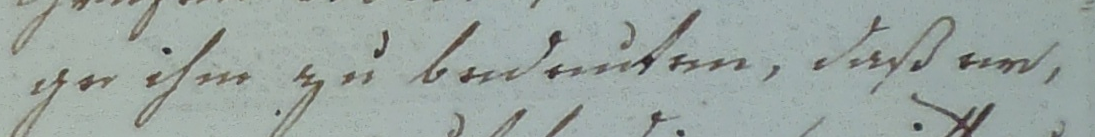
ge ihm zu bedeuten, daß er,
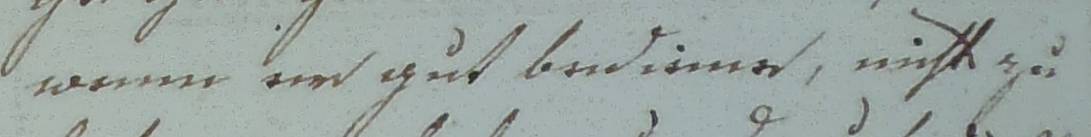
wenn er gut bediene, nichts zu
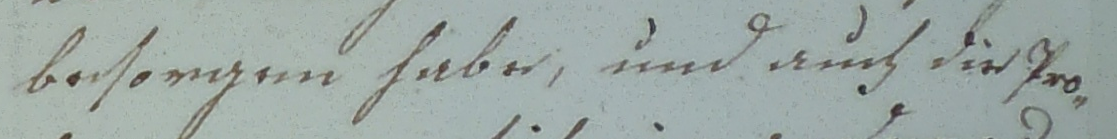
besorgen habe, und auch die Pro¬
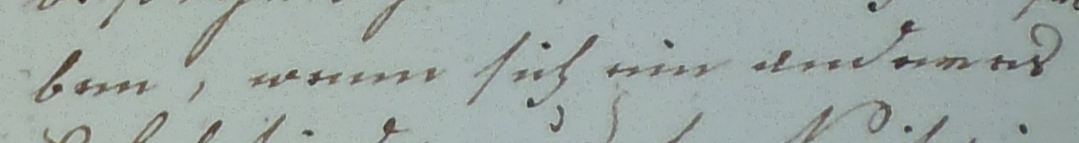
ben, wenn sich ein anderes
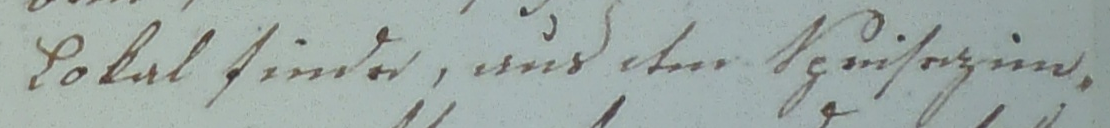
Lokal finde, aus den Speisezim¬
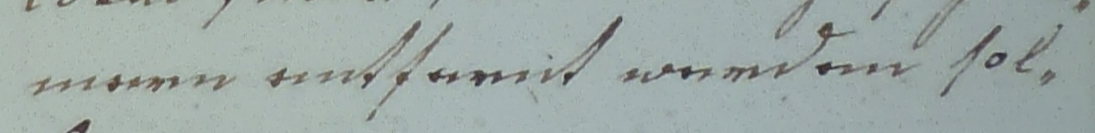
mern entfernt werden sol¬
